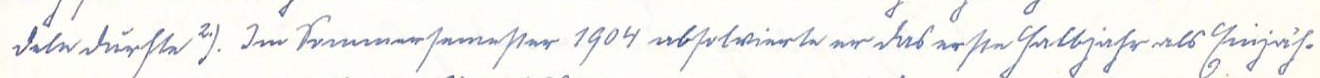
deln durfte. Im Sommersemester 1904 absolvierte er das erste Halbjahr als Einjäh-
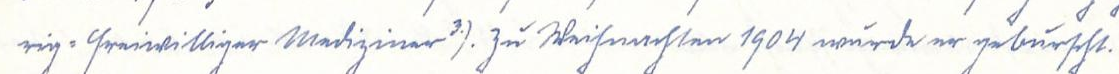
rig-freiwilliger Mediziner 3). Zu Weihnachten 1904 wurde er geburscht.
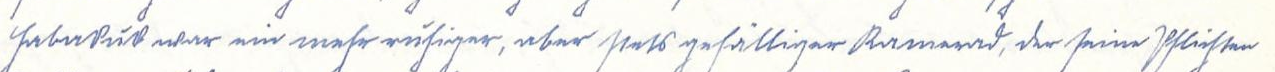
Habakuk war ein mehr ruhiger, aber stets gefälliger Kamerad, seine Pflichten
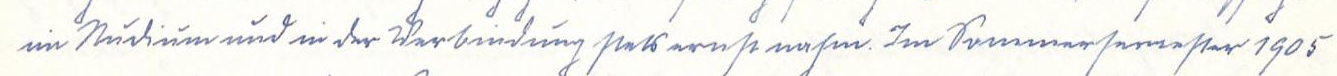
im Studium und in der Verbindung stets ernst nahm. Im Sommersemester 1905
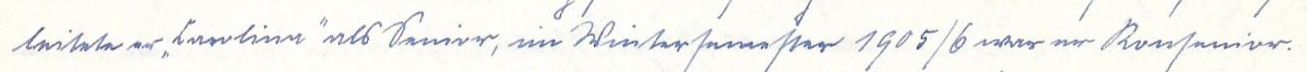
leitete er „Carolina“ als Senior, im Wintersemester 1905/6 war er Konsenior.
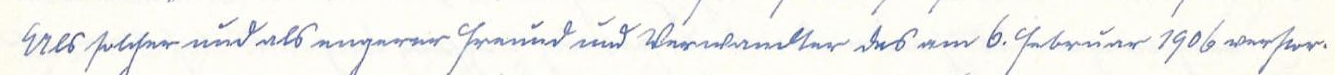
Als solcher und als enger Freund und Verwandter des am 6. Februar 1906 verstor-
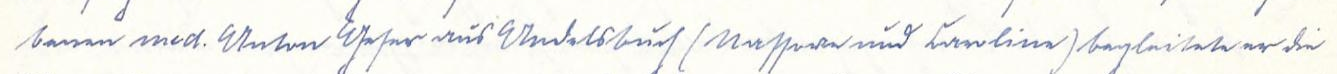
benen med. Anton Geser aus Andelsbuch (Nassowia und Carolina) begleitete er die
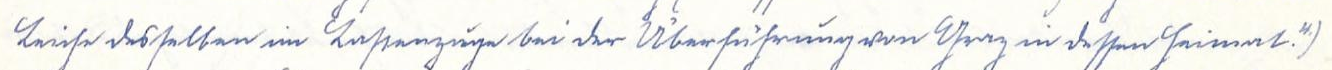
Leiche desselben im Lastenzuge bei der Überführung von Graz in dessen Heimat 4).
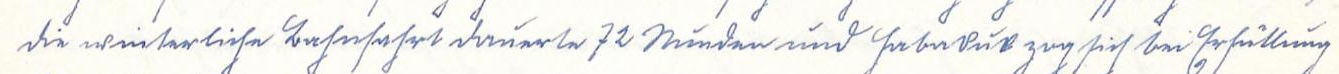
Die winterliche Bahnfahrt dauerte 72 Stunden und Habakuk zog sich bei Erfüllung
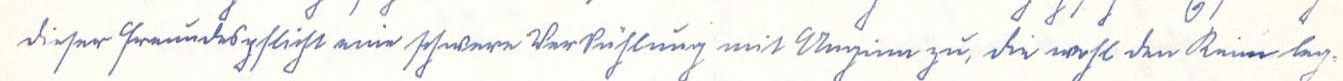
diese Freundespflicht eine schwere Verkündung mit Angina zu, die wohl den Keim leg-
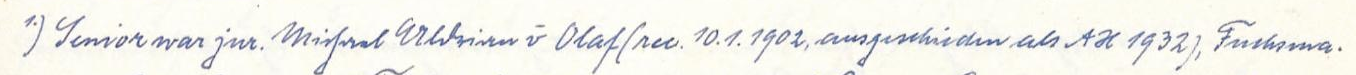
1) Senior war jur. Michael Aldrian v/o Olaf (rec. 10.1.1902, ausgeschieden als AH 1932), Fuchsma-
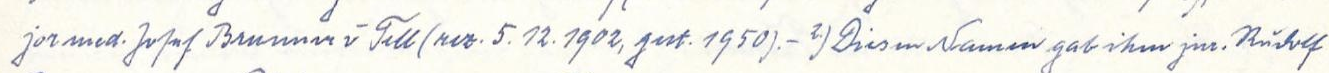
jor Med. Josef Brunner v/o Tell (rez. 5. 12. 1902, gest. 1950).- 2) Diesen Namen gab ihm jur. Rudolf
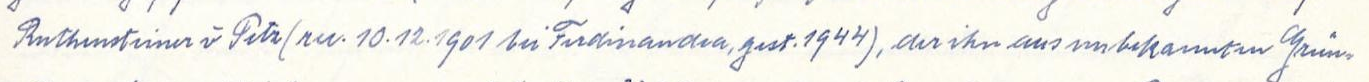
Steiner v/o Petz (rec. 10.12.1901 bei Ferdinandea, gest. 1944), der ihn aus unbekannten Grün-
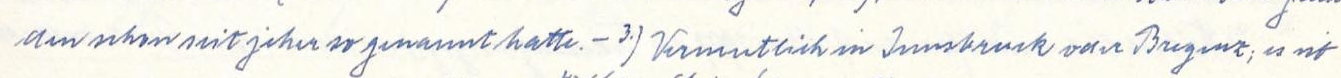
den schon seit jeher genannt hatte.- 3) Vermutlich in Innsbruck oder Bregenz; es ist
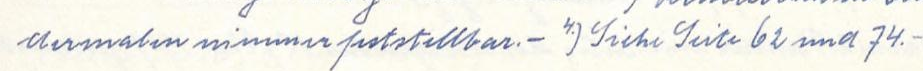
dermalen nimmer feststellbar.- 4) Siehe Seite 62 und 74.
